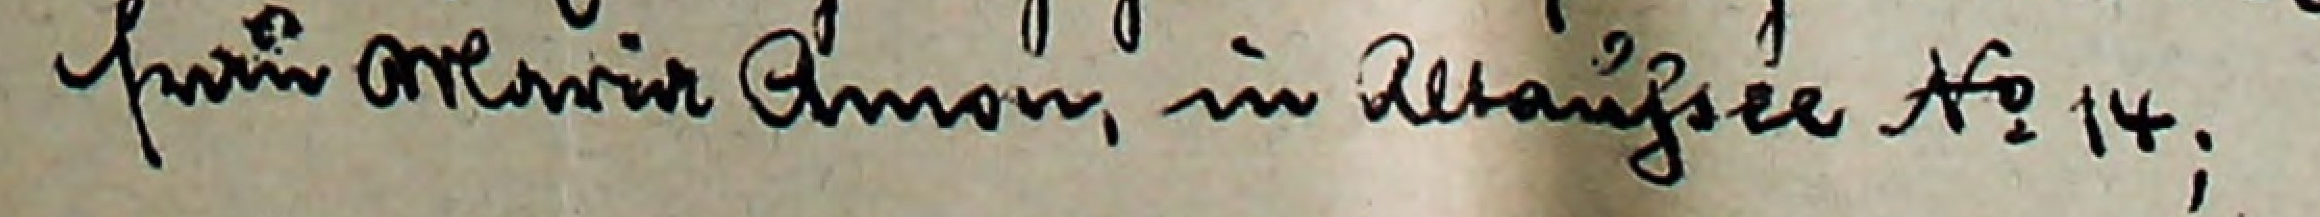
Frau Maria Amon, in Altaussee № 14;
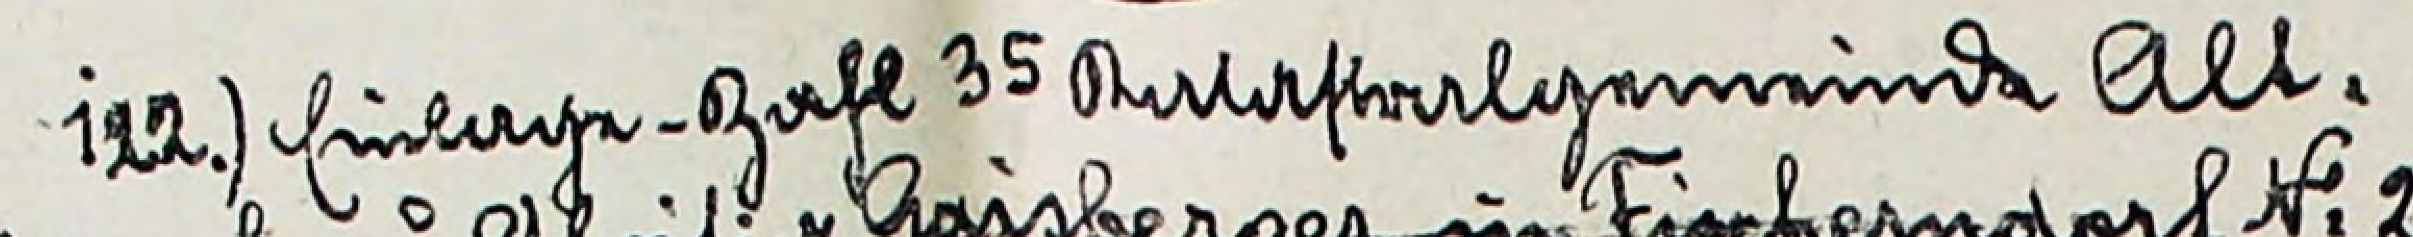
122.) Einlage - Zahl 35 Katastralgemeinde Alt=
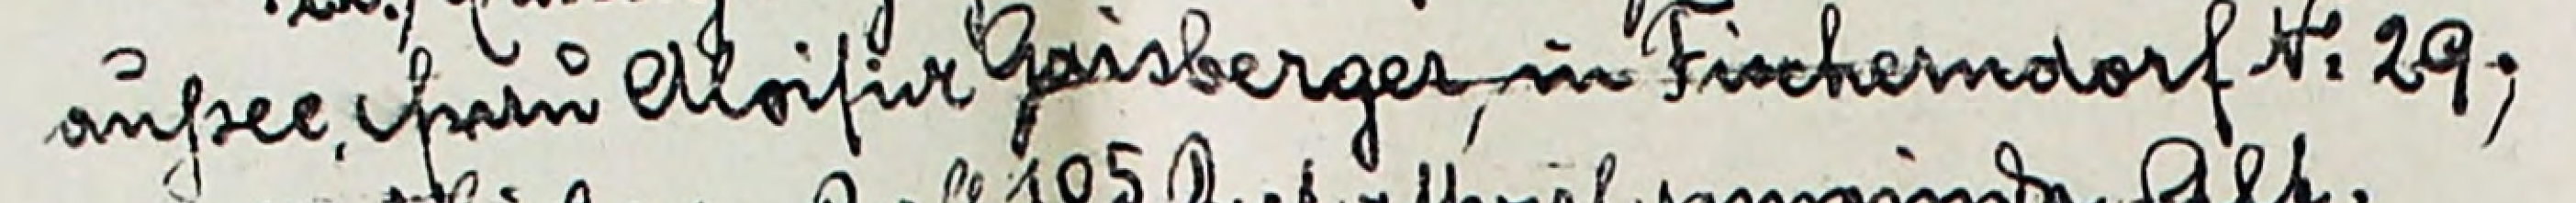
aussee, Frau Aloisia Gaisberger, in Fischerndorf № 29;
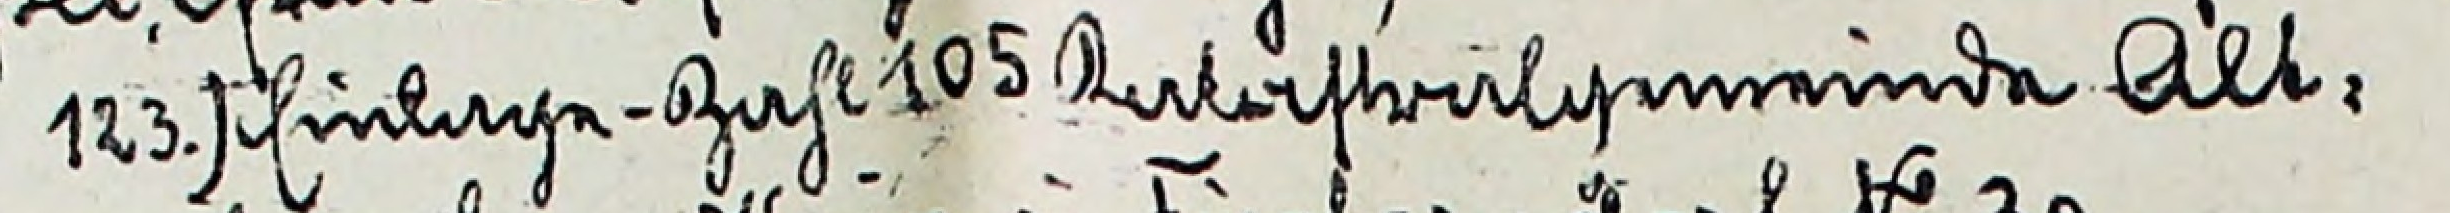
123.) Einlage - Zahl 105 Katastralgemeinde Alt=
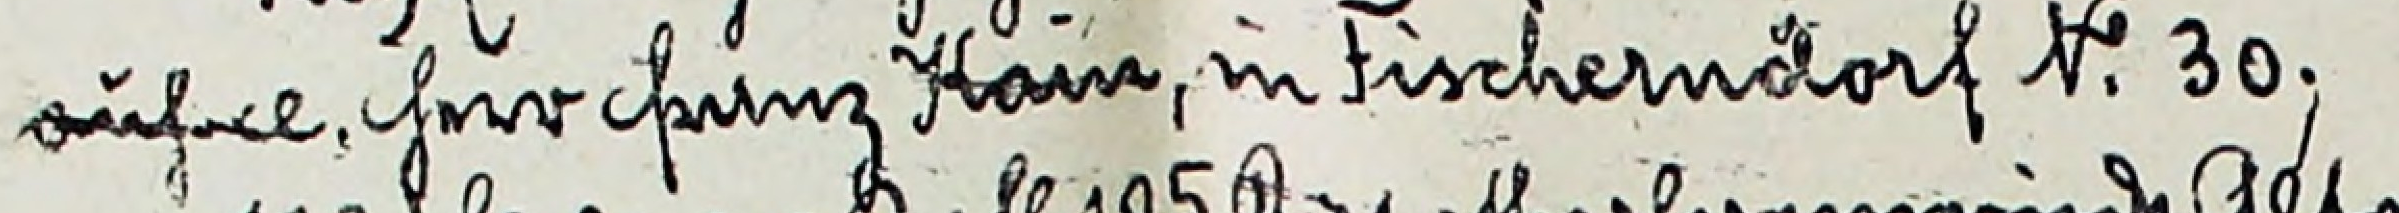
aussee, Herr Franz Kain, in Fischerndorf № 30;
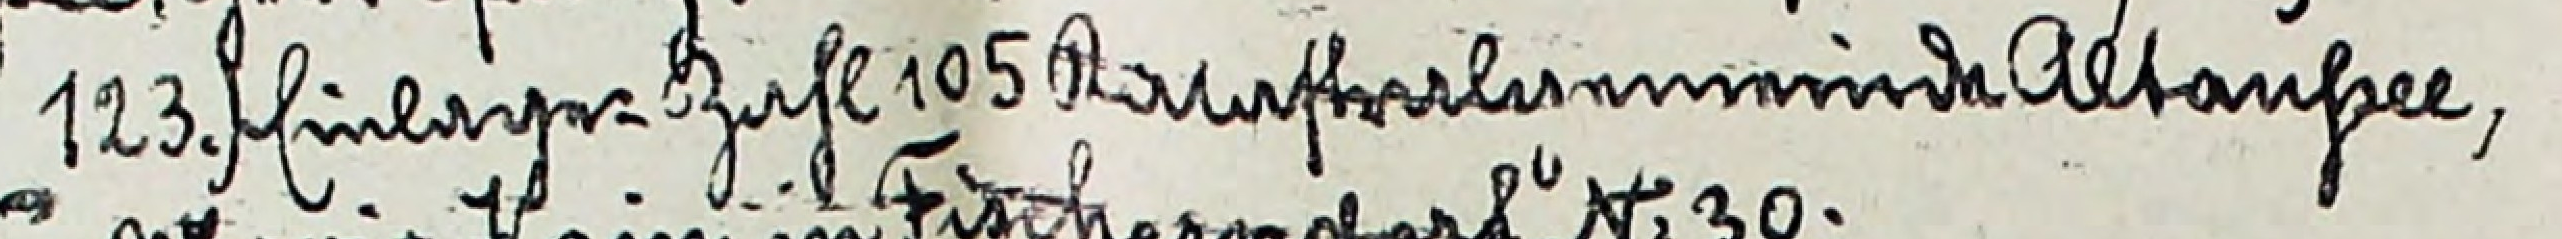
123.) Einlage - Zahl 105 Katastralgemeinde Altaussee,
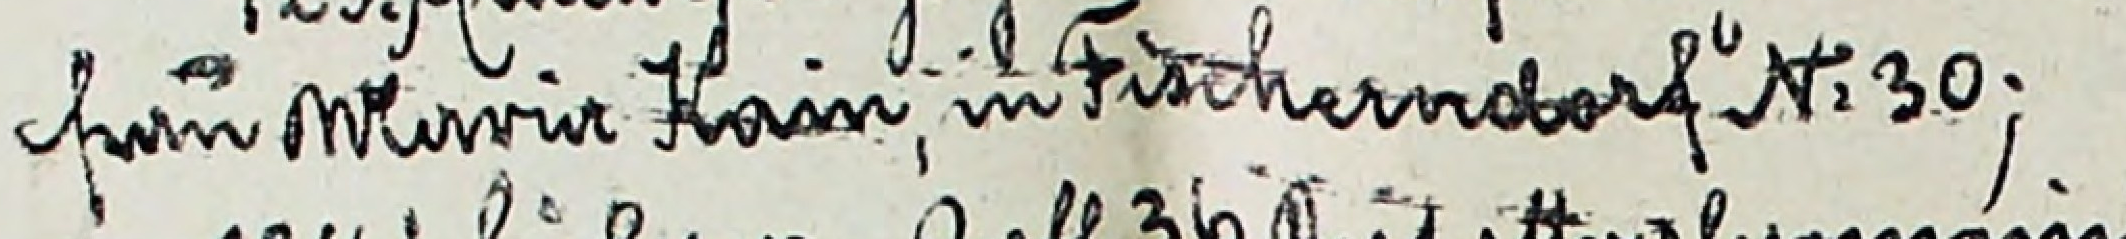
Frau Maria Kain, in Fischerndorf № 30;
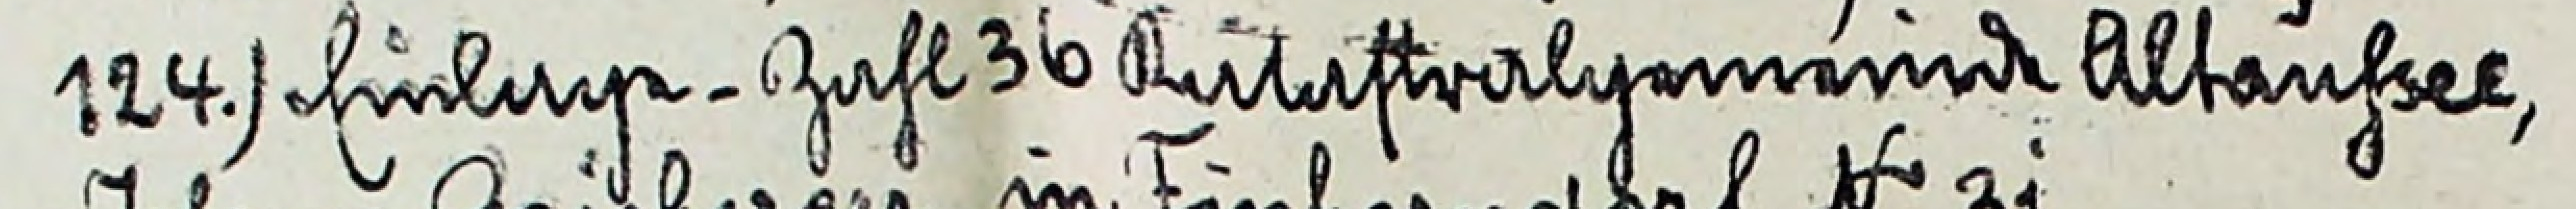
124.) Einlage - Zahl 36 Katastralgemeinde Altaussee,
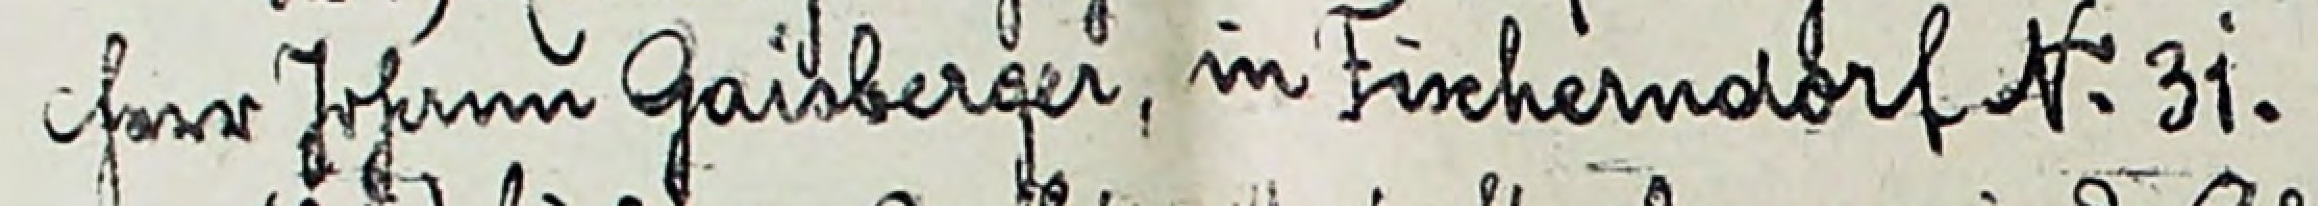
Herr Johann Gaisberger, in Fischerndorf № 31;
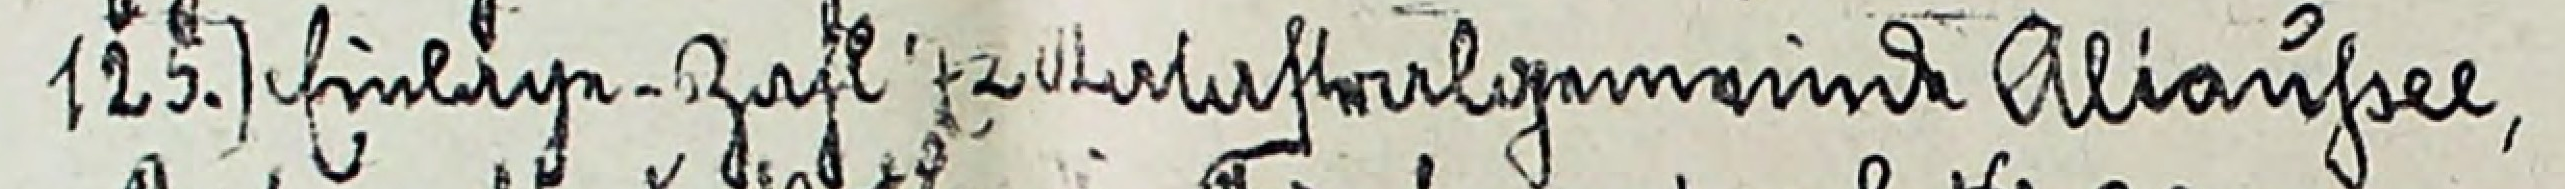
125.) Einlage - Zahl 72 Katastralgemeinde Altaussee,
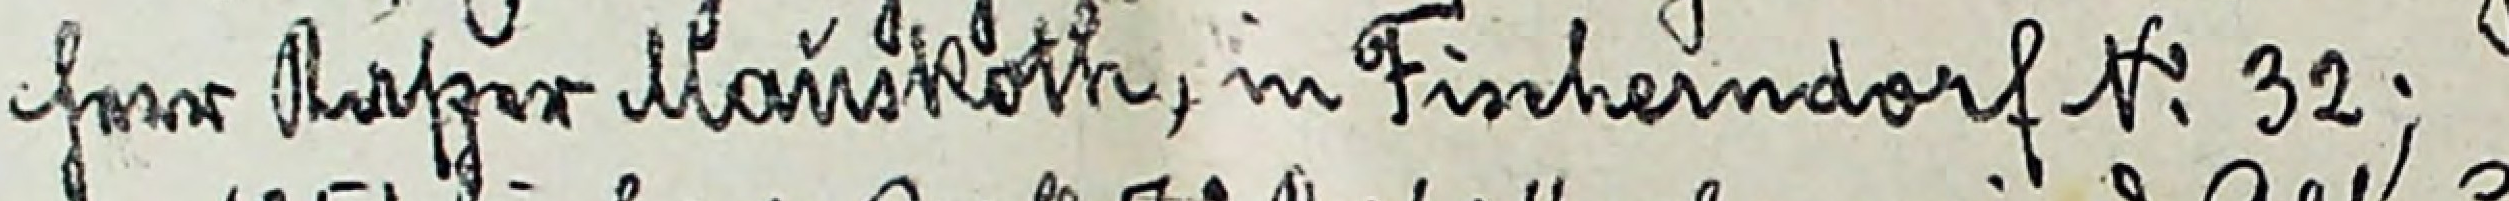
Herr Kasper Mauskoth, in Fischerndorf № 32;
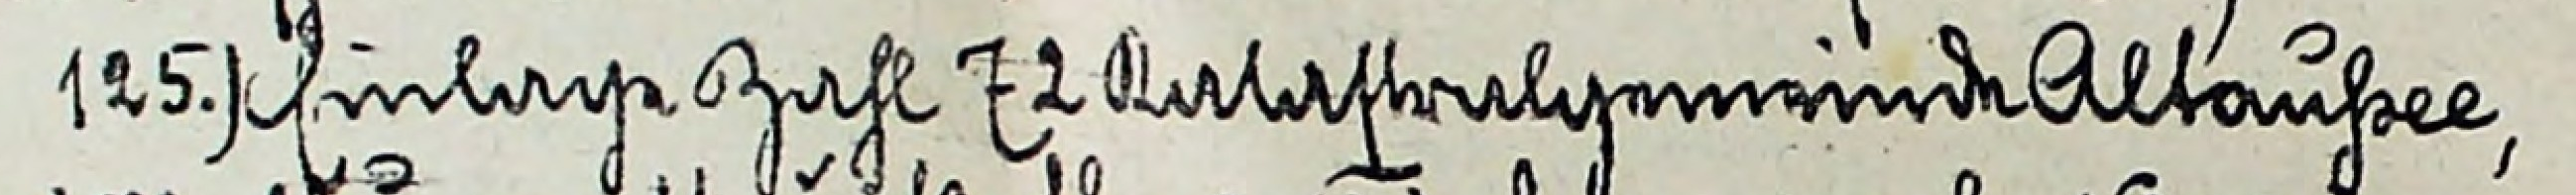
125.) Einlage - Zahl 72 Katastralgemeinde Altaussee,
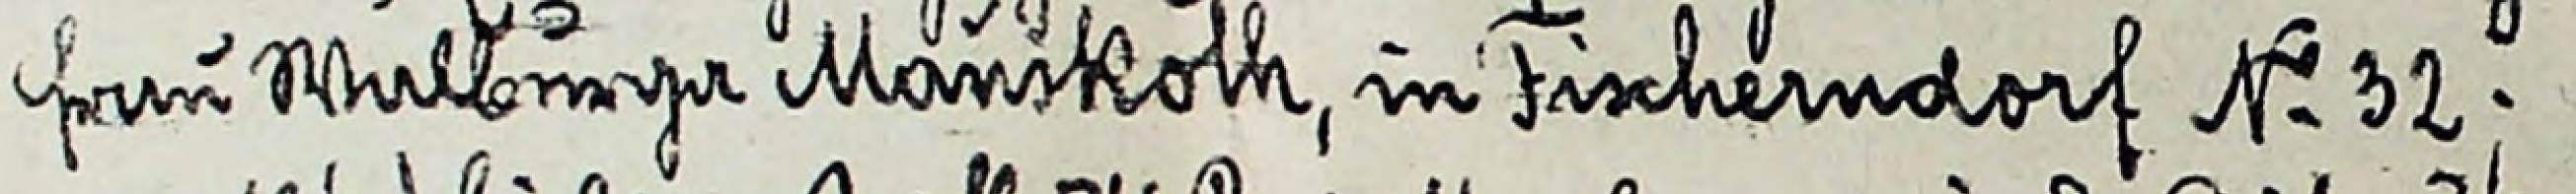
Frau Walburga Mauskoth, in Fischerndorf № 32;
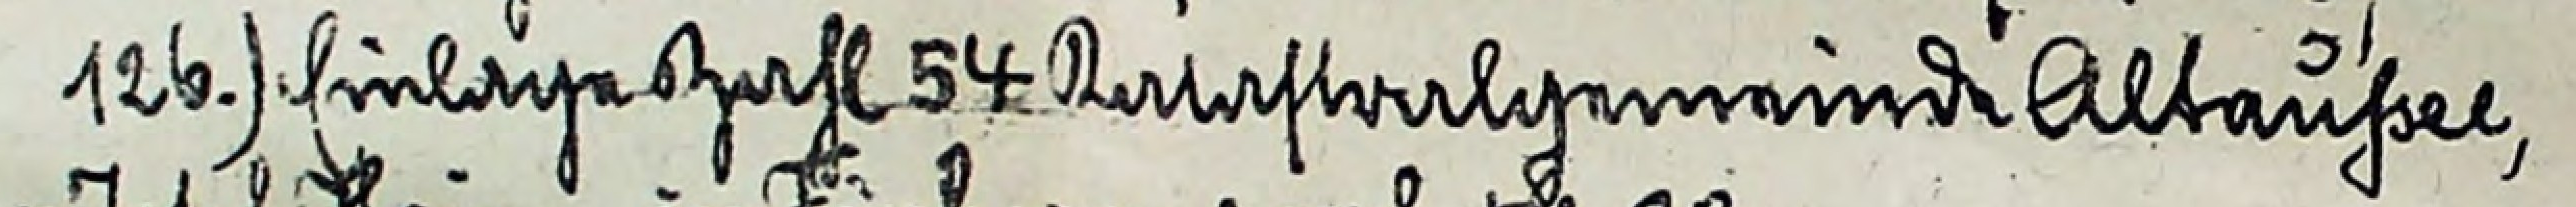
126.) Einlage - Zahl 54 Katastralgemeinde Altaussee,
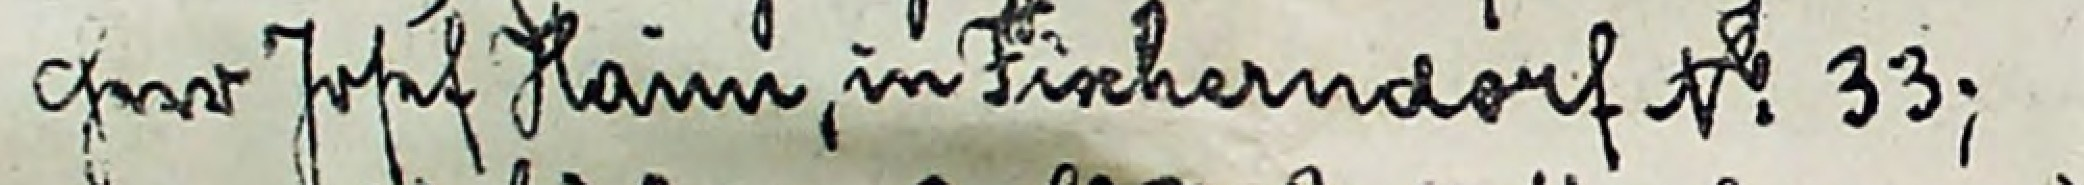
Herr Josef Haim, in Fischerndorf № 33;
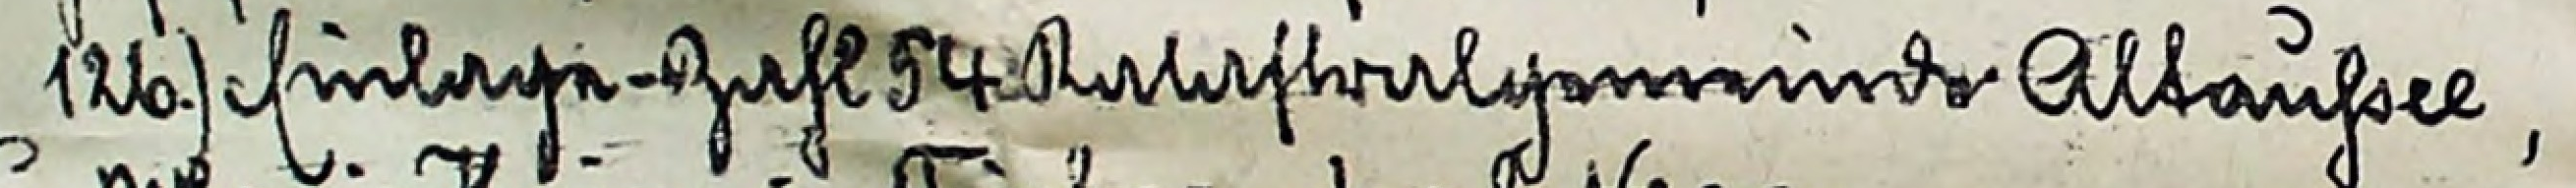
126.) Einlage - Zahl 54 Katastralgemeinde Altaussee,
